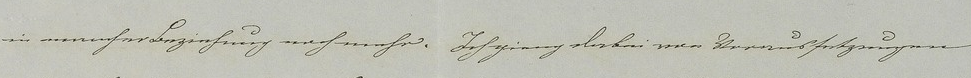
in mancher Beziehung noch mehr. Ich gieng dabei von Voraussetzungen
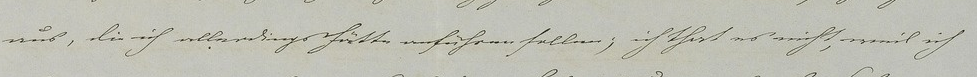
aus, die ich allerdings hätte anführen sollen; ich that es nicht, weil ich
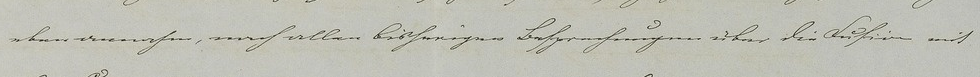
eben annahm, nach allen bisherigen Besprechungen über die Fusion mit
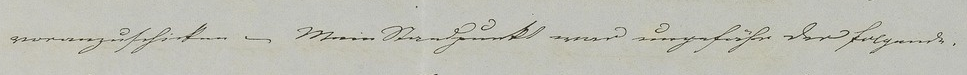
voranzuschicken. – Mein Standpunkt war ungefähr der folgende.
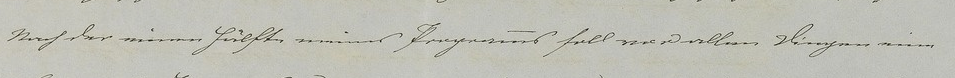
Nach der einen Hälfte meines Programms soll vor allen Dingen eine
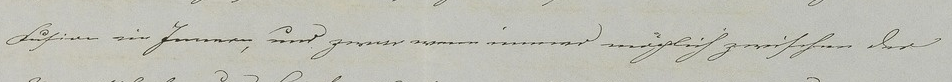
Fusion im Innern, und zwar wenn immer möglich zwischen der
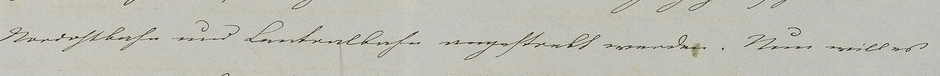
Nordostbahn und Centralbahn angestrebt werden. Nun will es
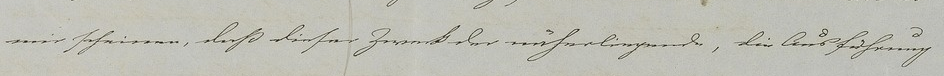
mir scheinen, daß dieser Zweck der näherliegende, die Ausführung
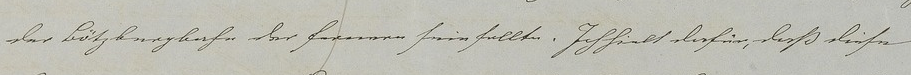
der Bötzbergbahn der fernere sein sollte. Ich hielt dafür, daß diese
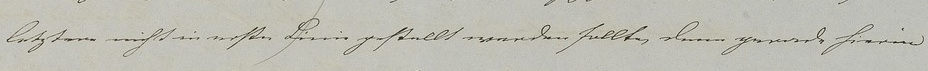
letztere nicht in erste Linie gestellt werden sollte, denn gerade hierin
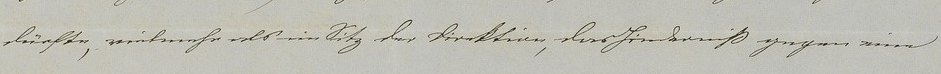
dürfte, vielmehr als im Sitz der Direktion, das Hinderniß gegen eine
